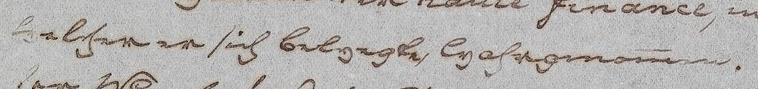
welcher er sich bewegte, wahrgenommen.
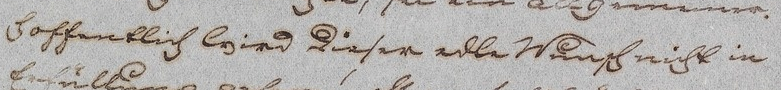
Hoffentlich wird dieser edle Wunsch nicht in
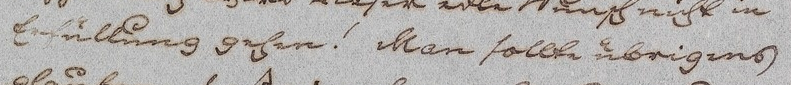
Erfüllung gehen! Man sollte übrigens
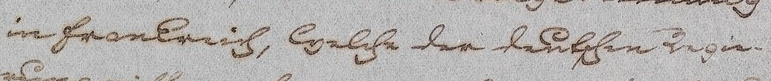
in Frankreich, welche der deutschen Regie-
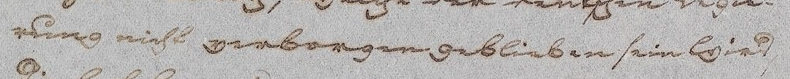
rung nicht verborgen geblieben sein wird,
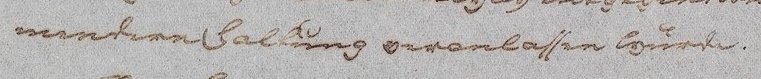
menderen Haltung veranlassen würde.
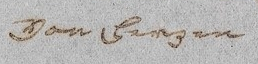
Von Herzen
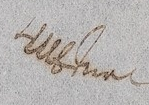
Escher
